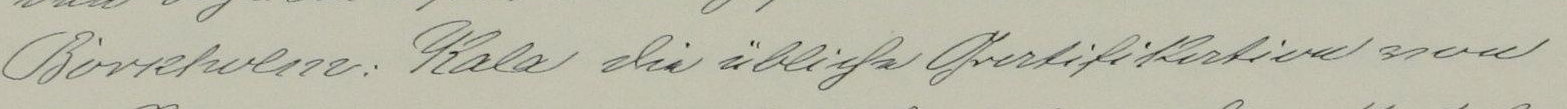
Borkholm: Kala die übliche Gratifikation von
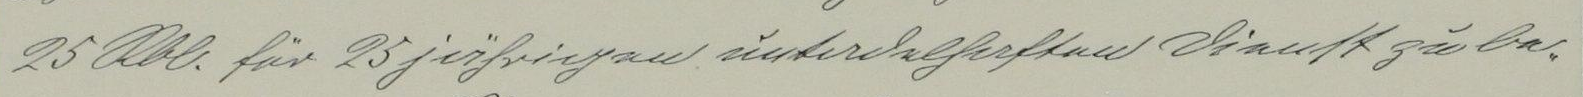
25 Rbl. für 25jährigen untadelhaften Dienst zu be-
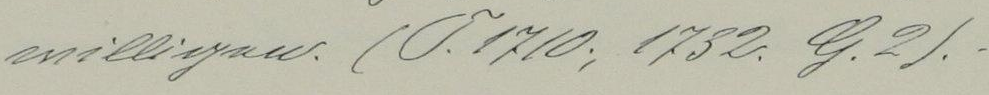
willigen. (T.1710; 1732. G.2).
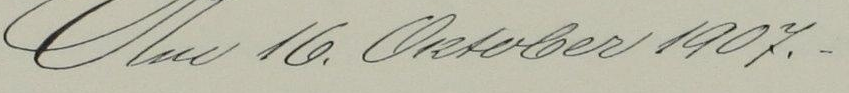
Am 16. Oktober 1907.
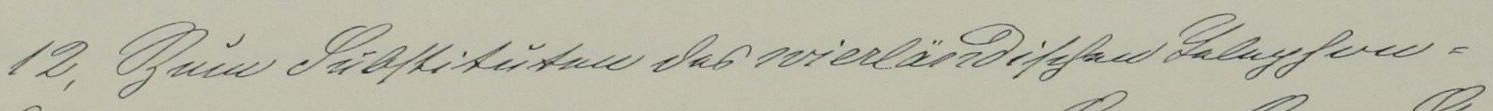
12. Zum Substituten des wierländischen Telephon-
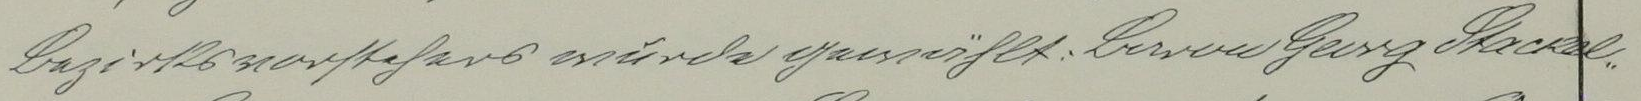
Bezirksvorstehers wurde gewählt: Baron Georg Stackel-
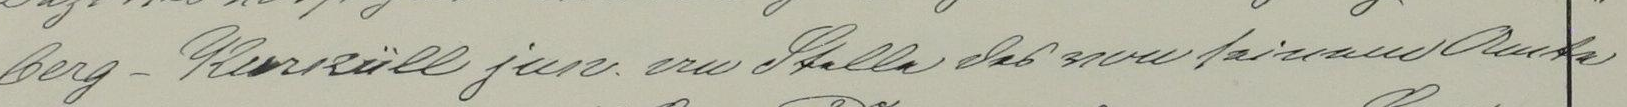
berg-Kurküll jun. an Stelle des von seinem Amte
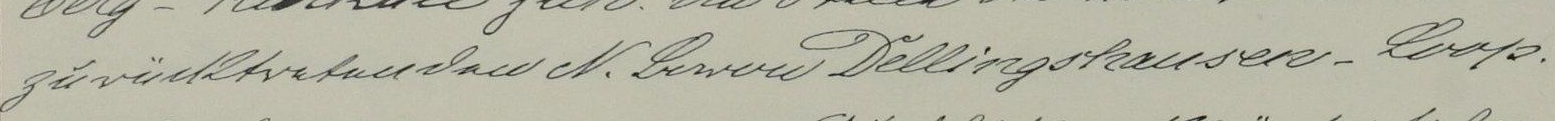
zurücktretenden N. Baron Dellingshausen-Loop.
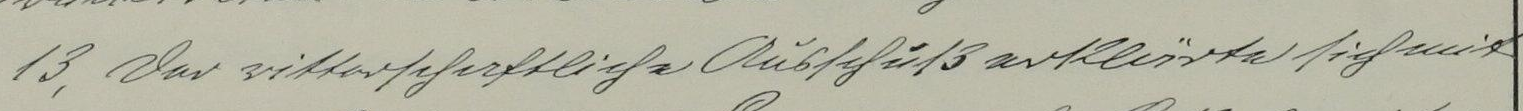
13. Der ritterschaftliche Ausschuß erklärte sich mit
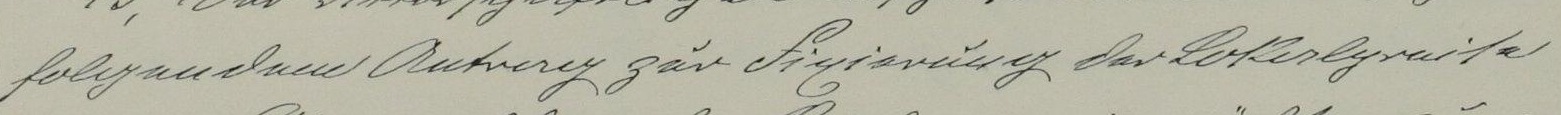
folgendem Antrag zur Fixierung der Lokalpreise
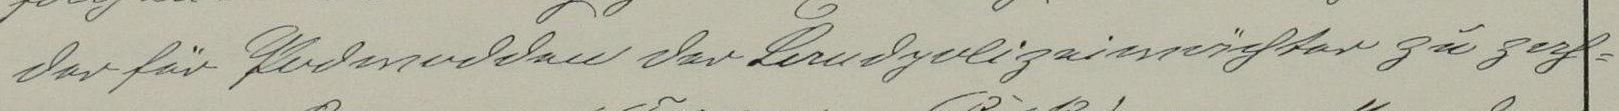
der für Podwodden der Landpolizeiwächter zu zah-
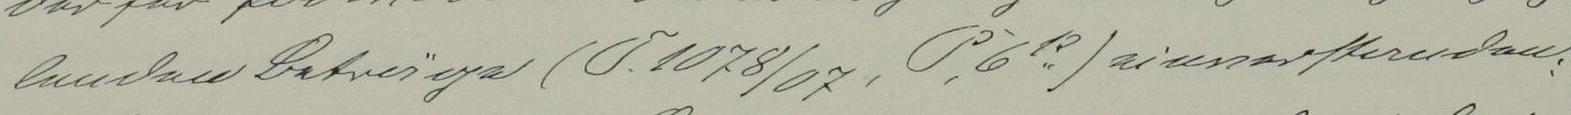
lenden Beträge (T.1078/07, P.6p) einverstanden.
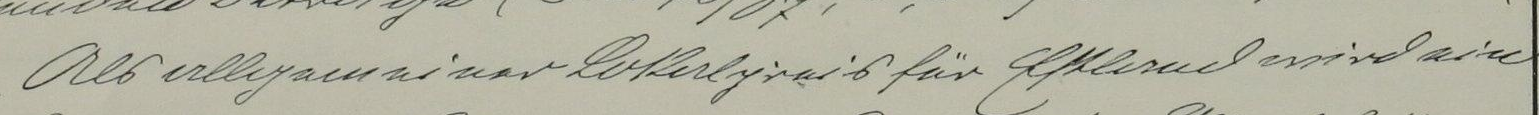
„Als allgemeiner Lokalpreis für Estland wird ein
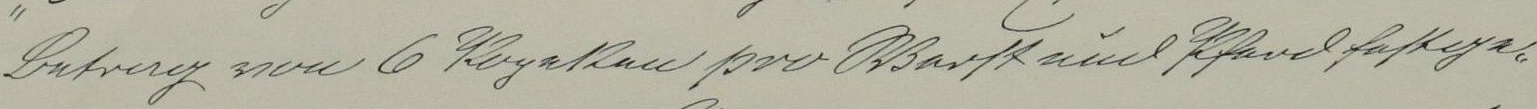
Betrag von 6 Kopeken pro Werst und Pferd festge-
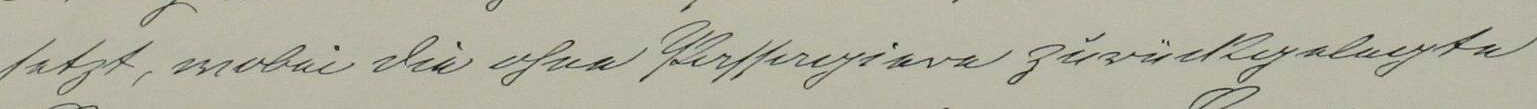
setzt, wobei die ohne Passagiere zurückgelegte
